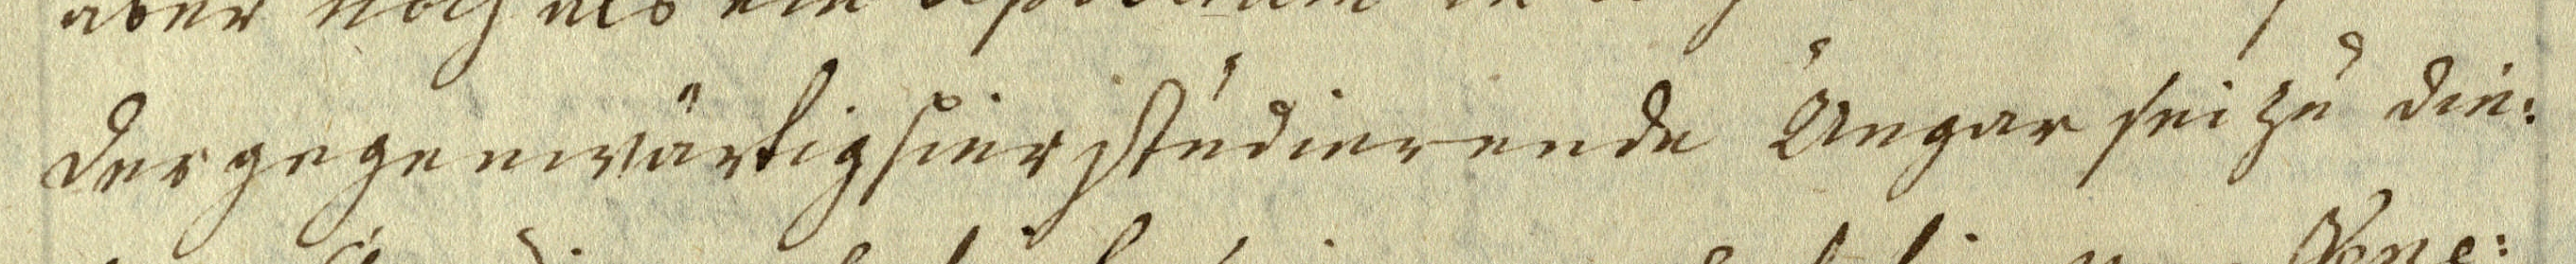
Der gegenwärtig hier studierende Ungar sei zu die¬
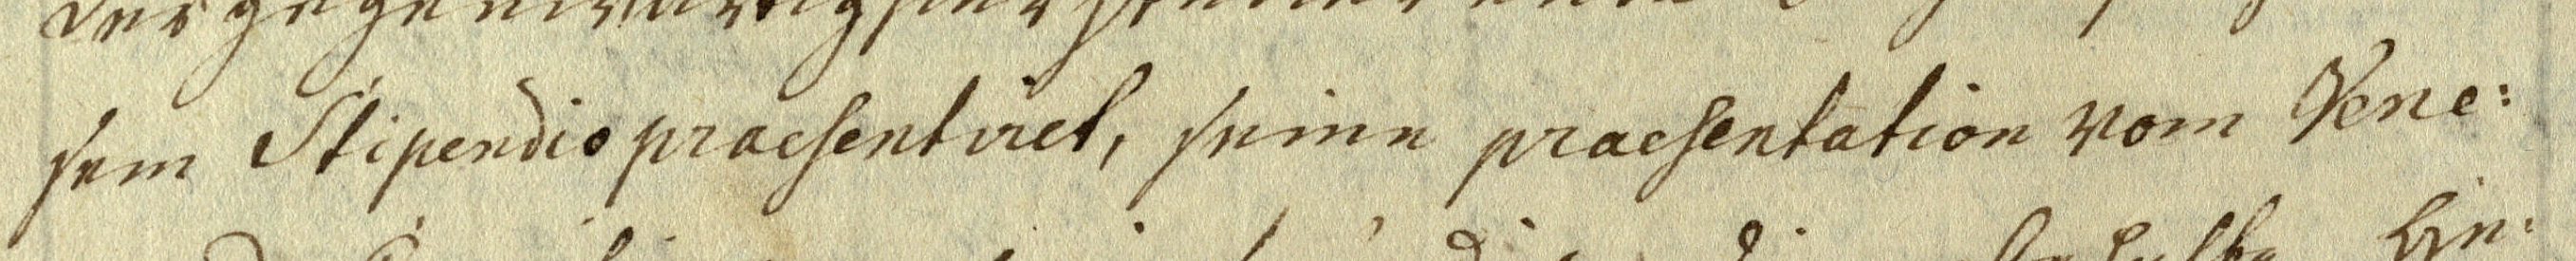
sem Stipendio praesentiret, seine praesentation vom Vene¬
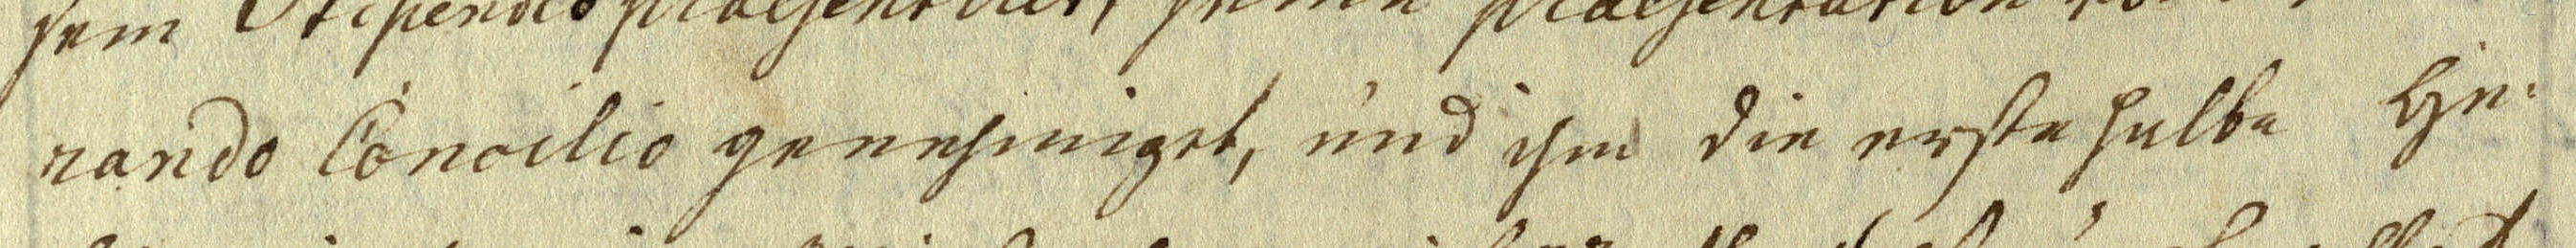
rando Concilio genehmigt, und ihm die erste halbe He¬
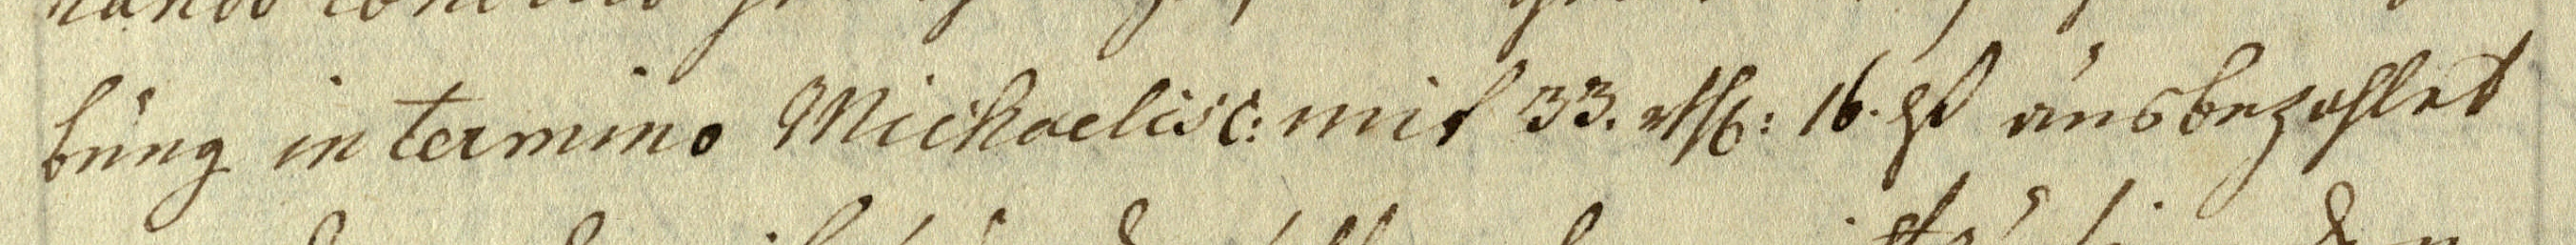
bung in termino Michaelis c. mit 33. r. 16.s. ausbezahlet
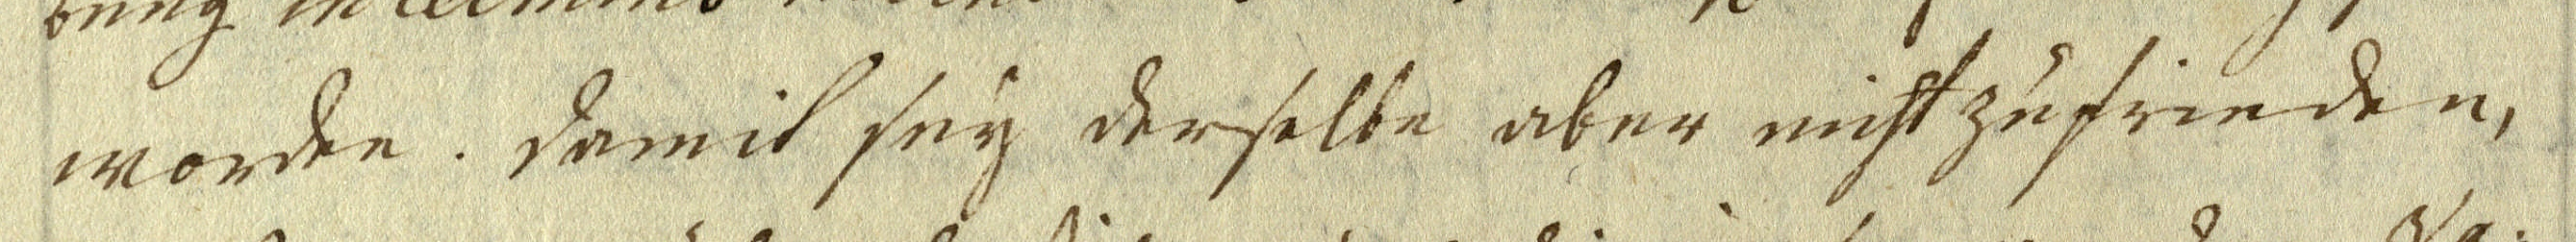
worden. Damit seÿ derselbe aber nicht zufrieden,
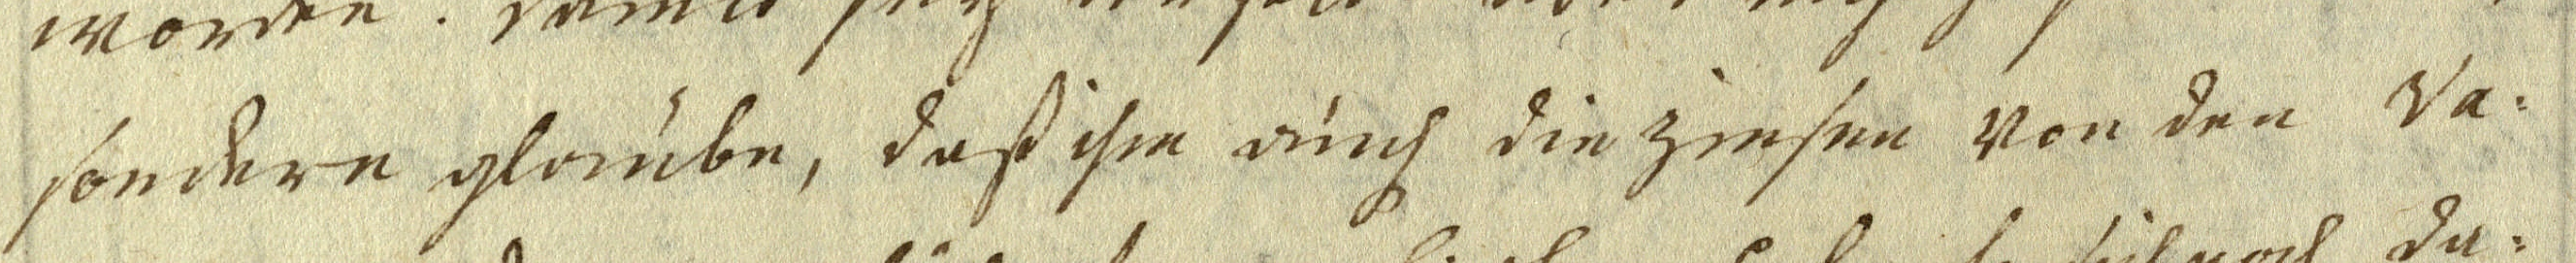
sondern glaube, daß ihm auch die zinsen von den Va¬
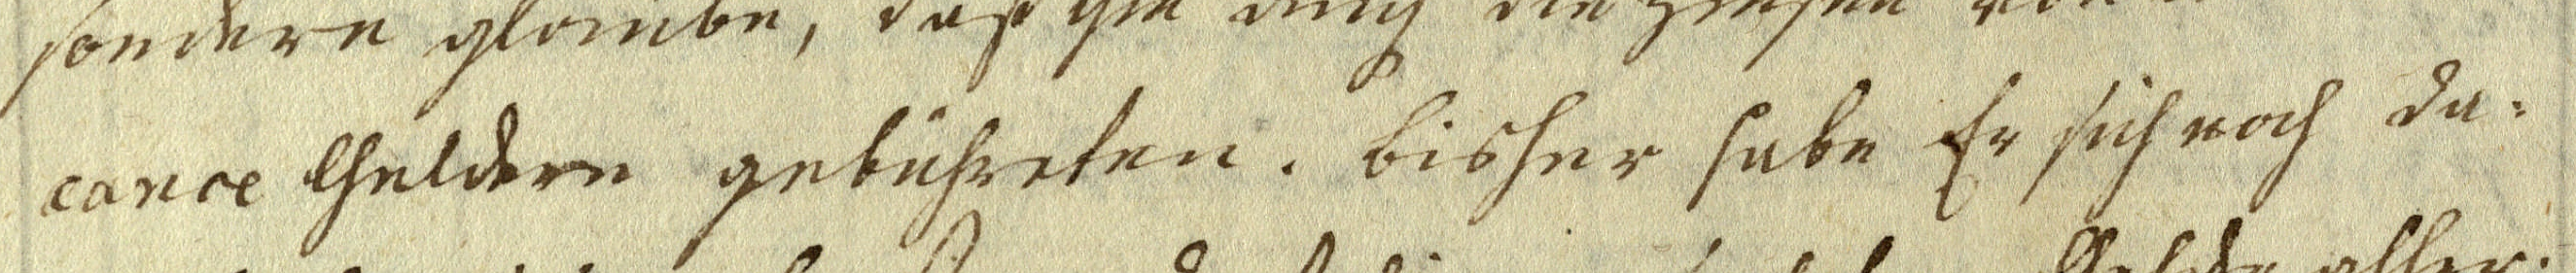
cance Geldern gebühreten. Bisher habe Er sich noch da¬
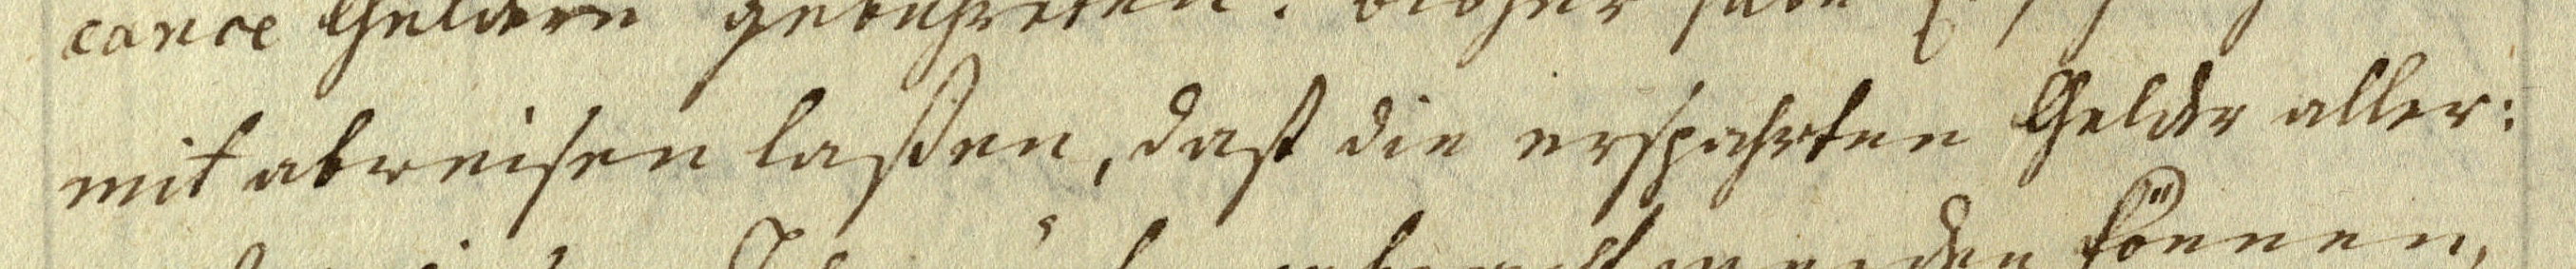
mit abweisen laßen, daß die erspahrten Gelder aller¬
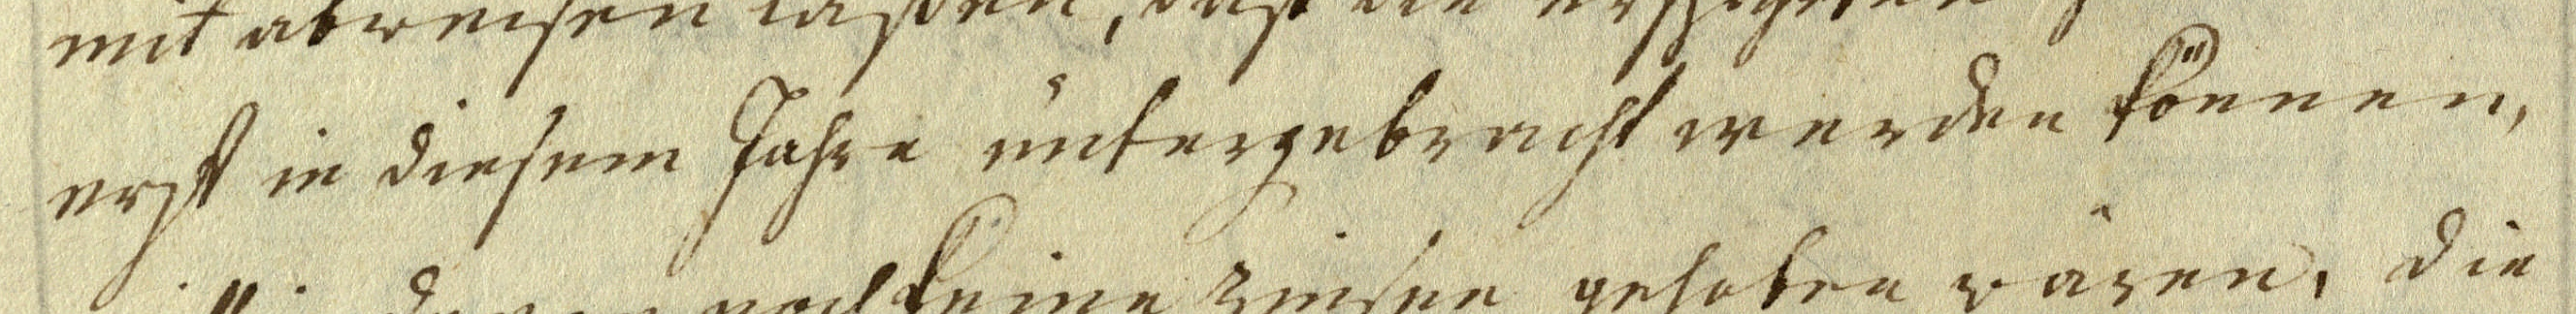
erst in diesem Jahre untergebracht werden können,
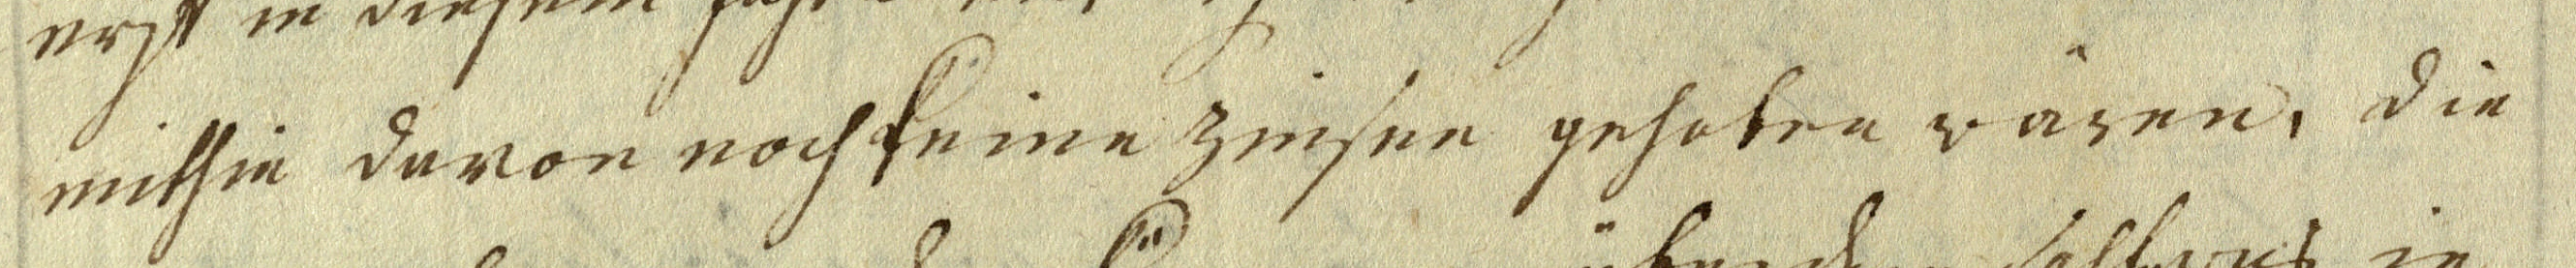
mithin davon noch keine Zinsen gehoben wären, die
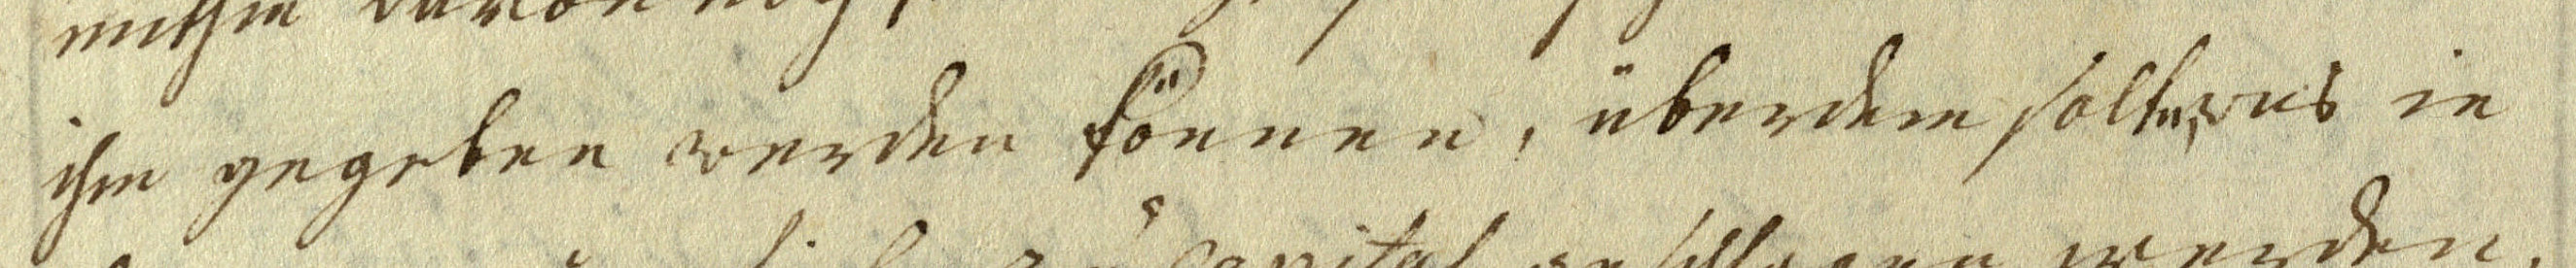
ihm gegeben werden können, überdem solte,was in
